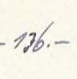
136
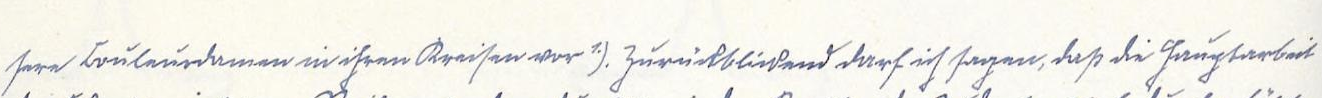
sere Couleurdamen in ihren Kreisen vor 1) Zurückblickend darf ich sagen, daß die Hauptarbeit
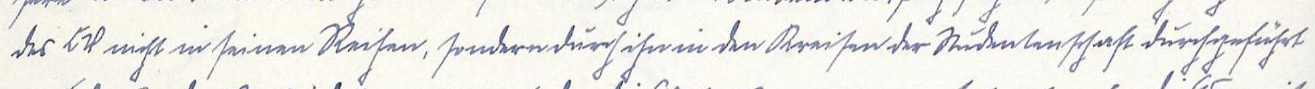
des CV nicht in seinen Reihen, sondern durch ihn in den Kreisen der Studentenschaft durchgeführt
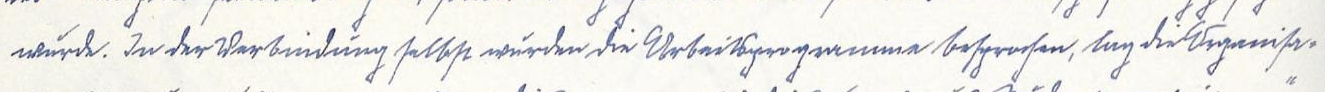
wurde. In der Verbindung selbst wurden die Arbeitsprogramme besprochen, lag die Organisi-
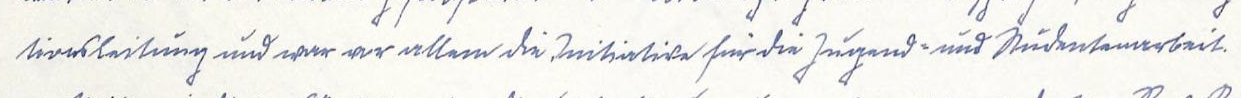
tionsleitung und war vor allen die Initiative für die Jugend- und Studentenarbeit-
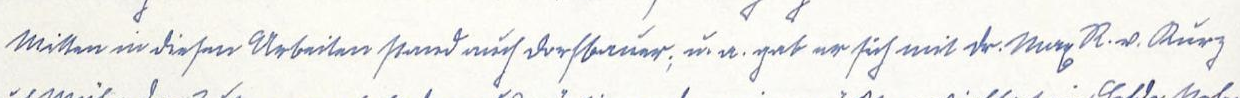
Mitten in diesen Arbeiten stand auch Dorfbauer, u. gab er sich mit Dr. Max R. v. Kurz
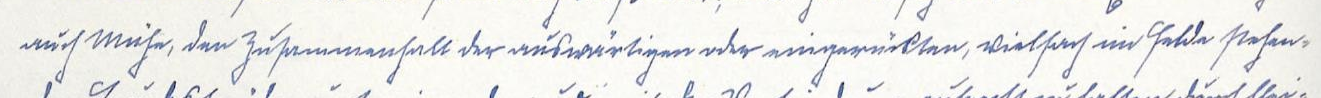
auch Mühe, den Zusammenhalt der auswärtigen oder eingerückten, vielfach im Felde stehen-
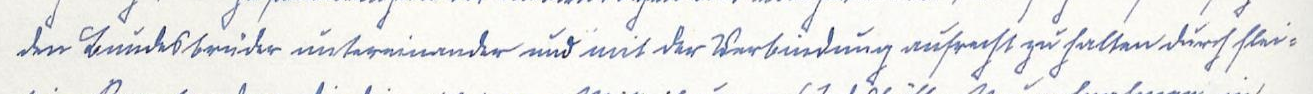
den Bundesbrüder untereinander und mit der Verbindung aufrecht zu halten durch flei-
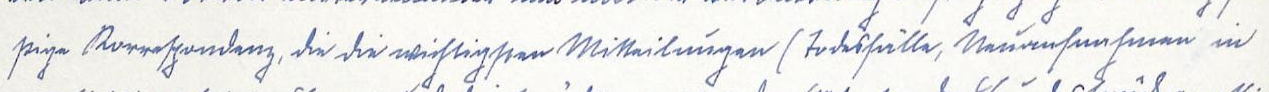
ßige Korrespondenz, die die wichtigsten Mitteilungen (Todesfälle, Neuanfnahmen in
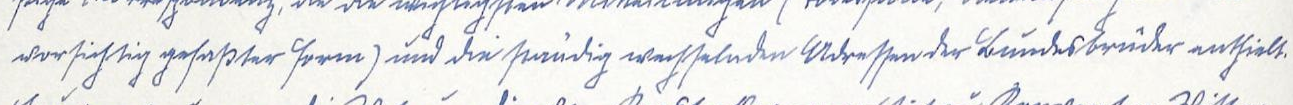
vorsichtig gefaßter Form) und die ständig wechselnden Adressen der Bundesbrüder enthielt.
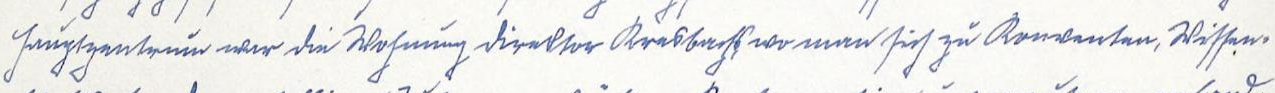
Hauptzentrum war die Wohnung Direktor Kresbachs woman sich zu Konventen, Wissen-
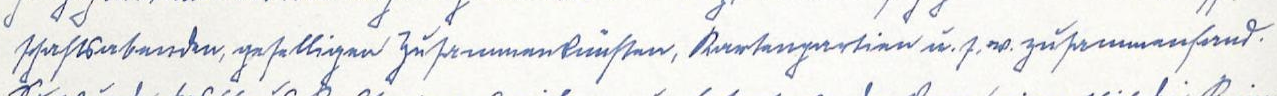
schaftsabenden, geselligen Zusammenkünften, Kartenpartien u. s. war. zusammenfand.
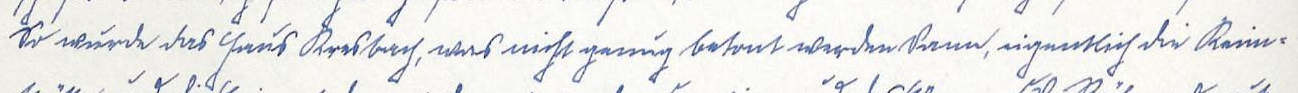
So wurde das Haus Kresbach, was nicht genug betont werden kann, eigentlich die Keim-
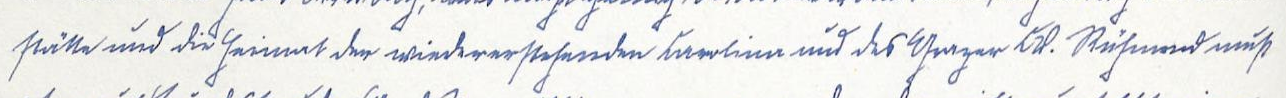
stätte und die Heimat der wiedererstehenden Carolina und des Grazer CV. Rühmend muß
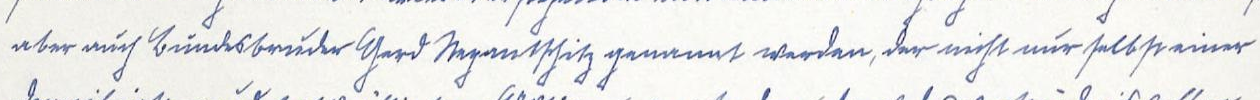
aber auch Bundesbruder Gerd Steantschitz genannt werden, der nicht nur selbst eine
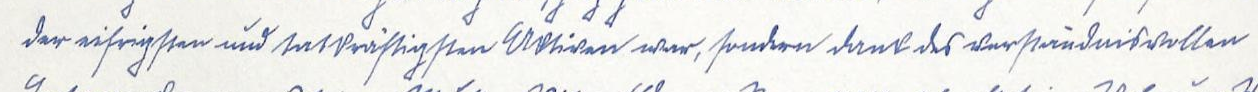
der efrigsten und tatkräftigsten Aktiven war, sondern Dank des verständnisvollen
